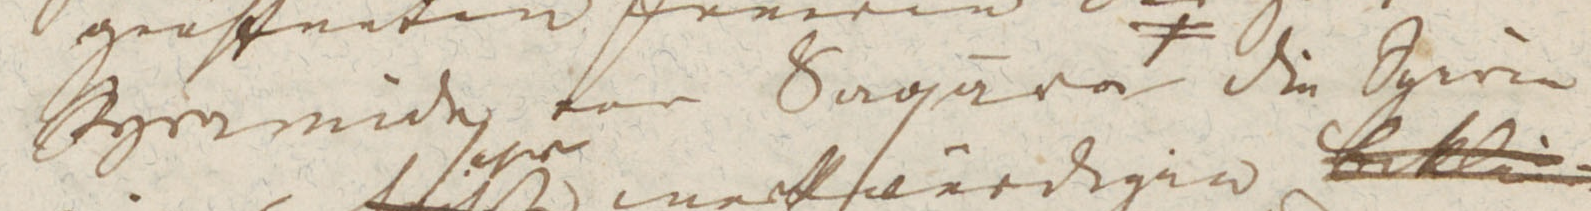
Pyramide von Saqara % die Spuren
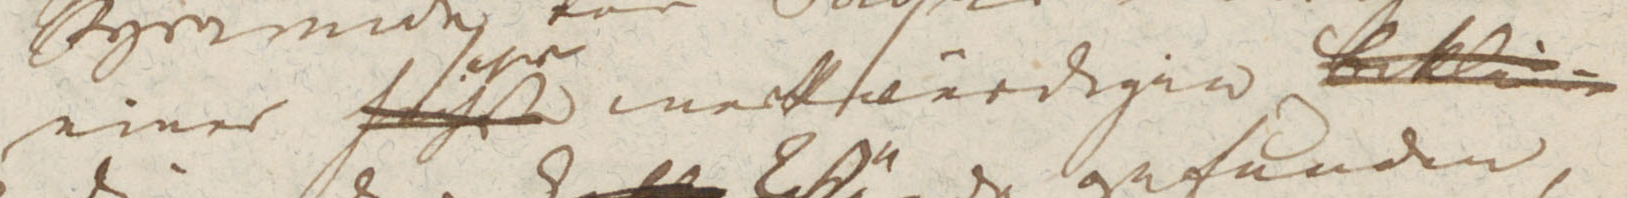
einer höchst sehr merkwürdigen Beklei-
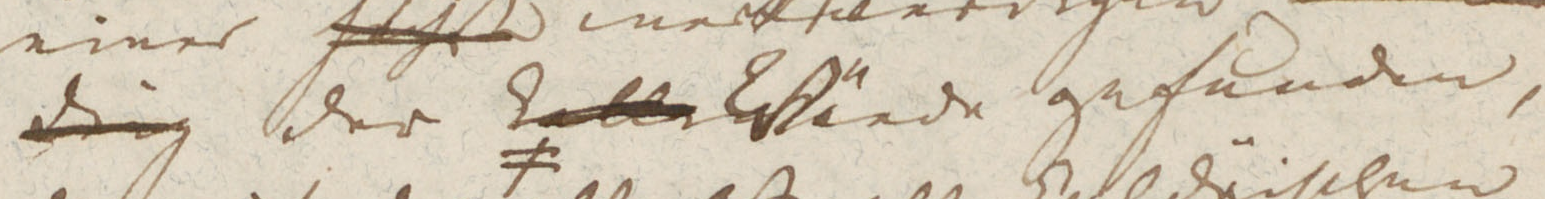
dung der kallwWände gefunden,
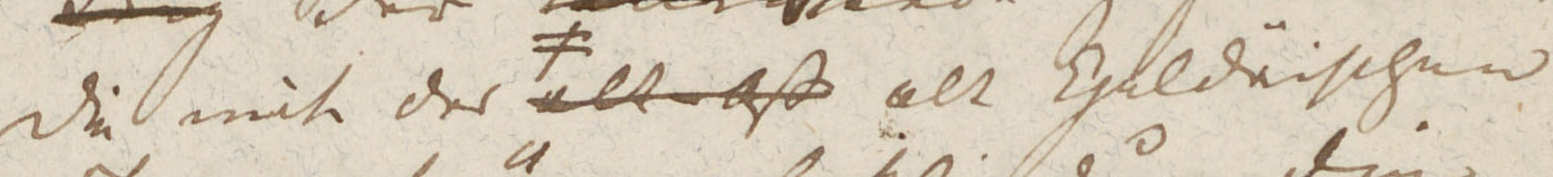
die mit der % alt-Ass alt Chaldäischen
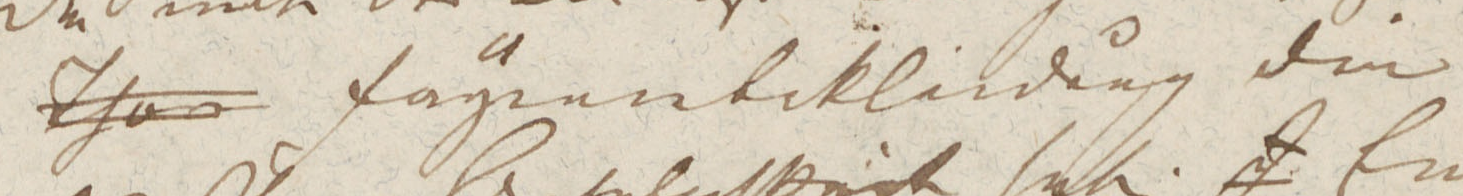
Thon Fayencebekleidung die
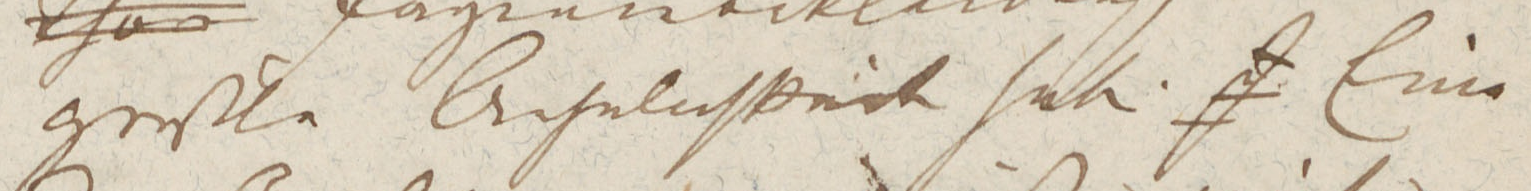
grosste Aehnlichkeit hat. I Eine
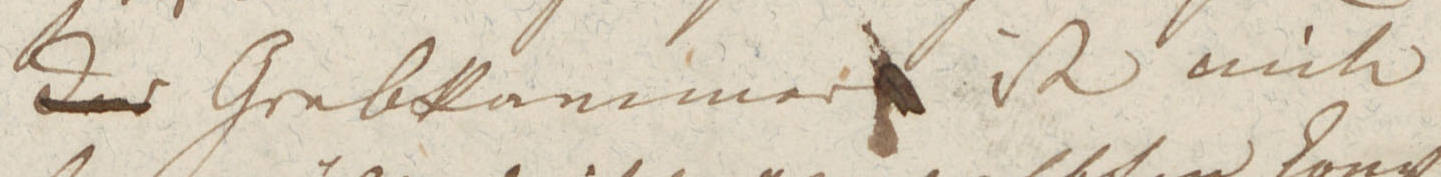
des Grabkammers ist mit
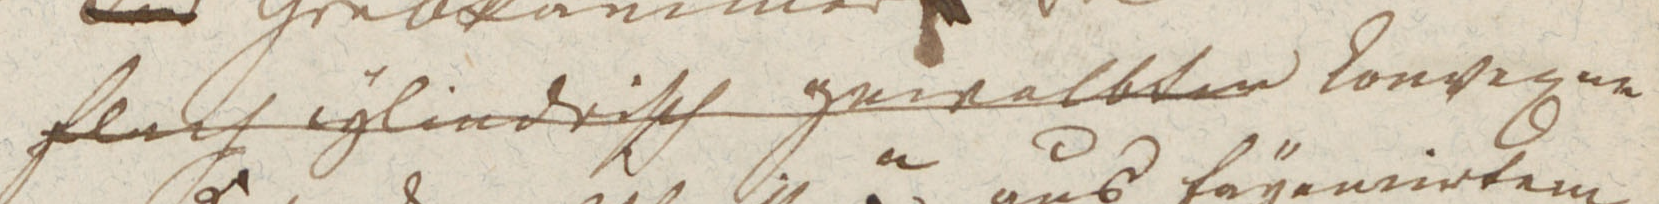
flach cylindrisch gewolbter konvexen
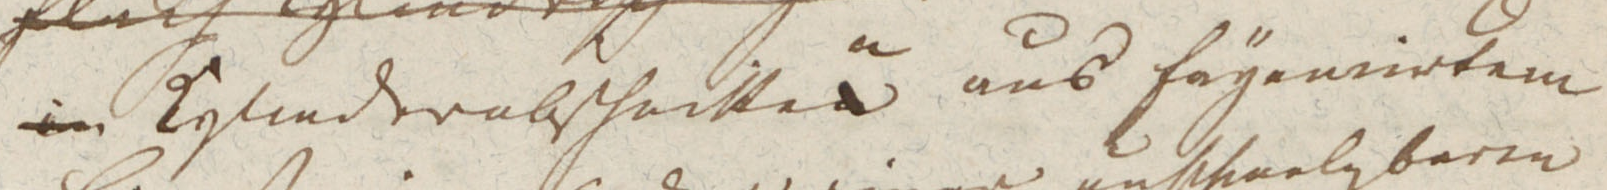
in cCylinderabschnittenn aus fayencirtem
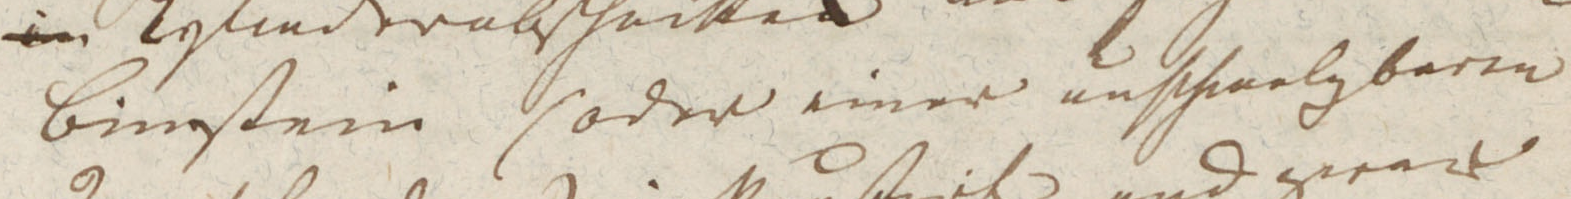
Bimstein (oder einer unschmelzbaren
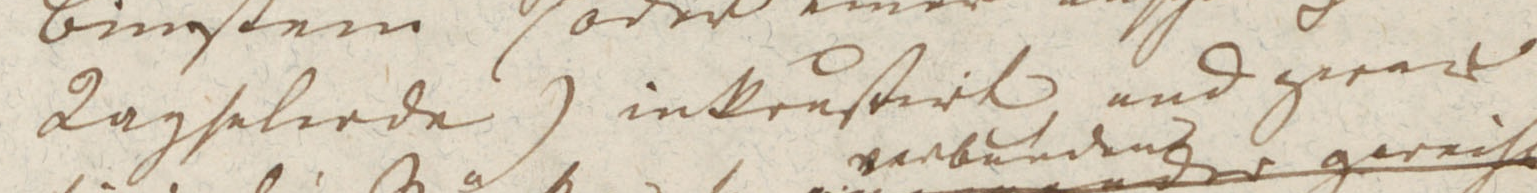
Kapselerde) inkrustirt und zwar
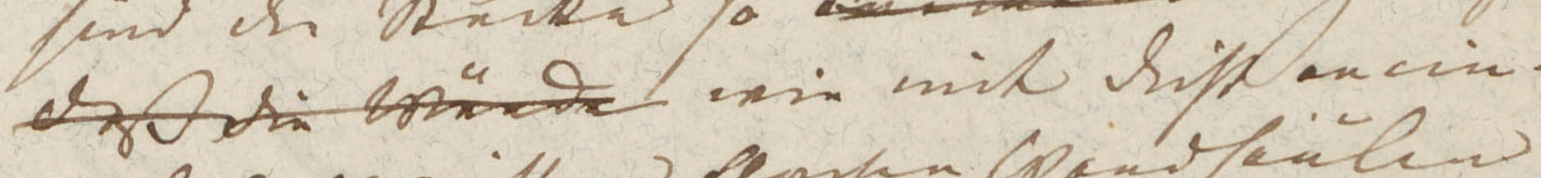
dass die Wände wie mit dicht anein-
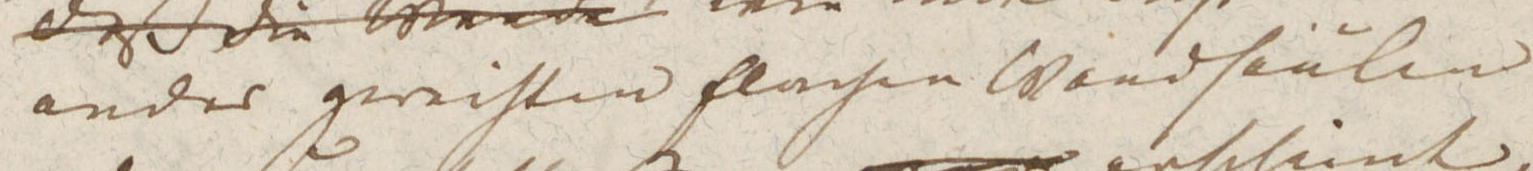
ander gereihten flachen Wandsäulen
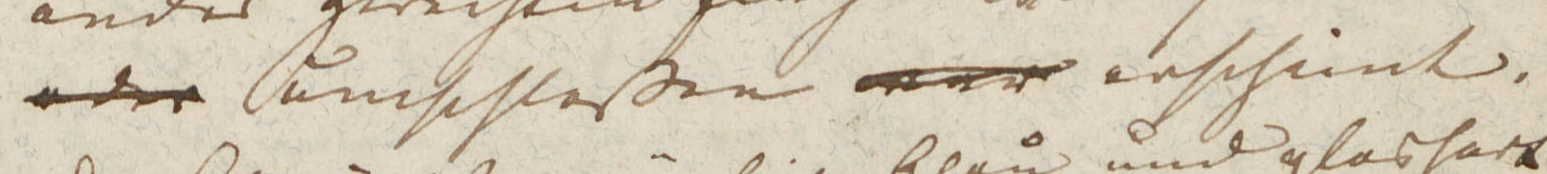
oder umschlossen war erscheint.
